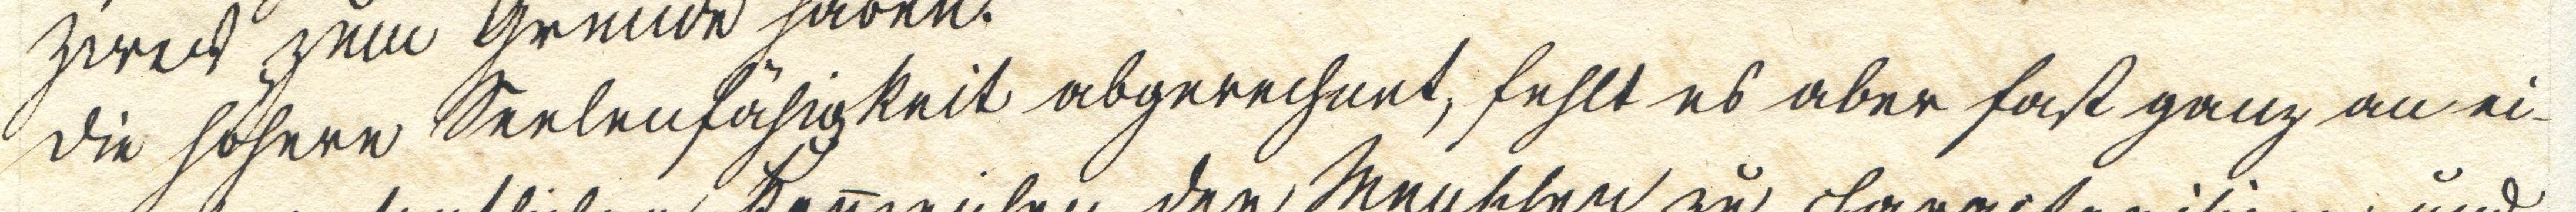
Die höhere Seelenfähigkeit abgerechnet, fehlt es aber fast ganz an ei-
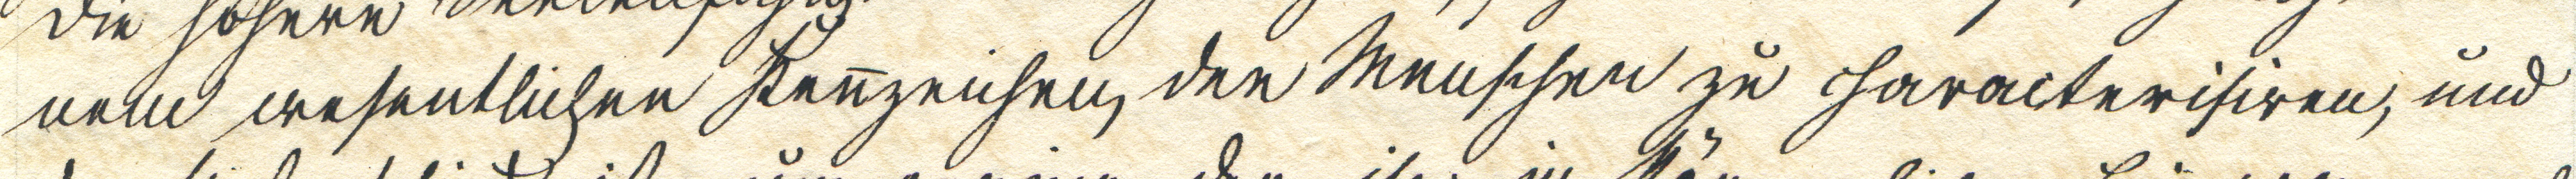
nem wesentlichen Keñzeichen, den Menschen zu characterisiren, und
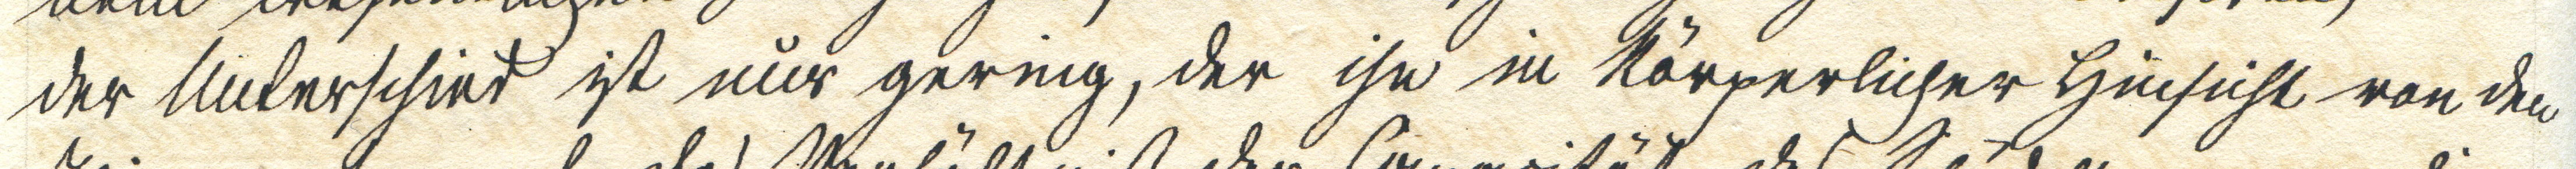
der Unterschied ist nur gering, der ihn in Körperlicher Hinsicht von den
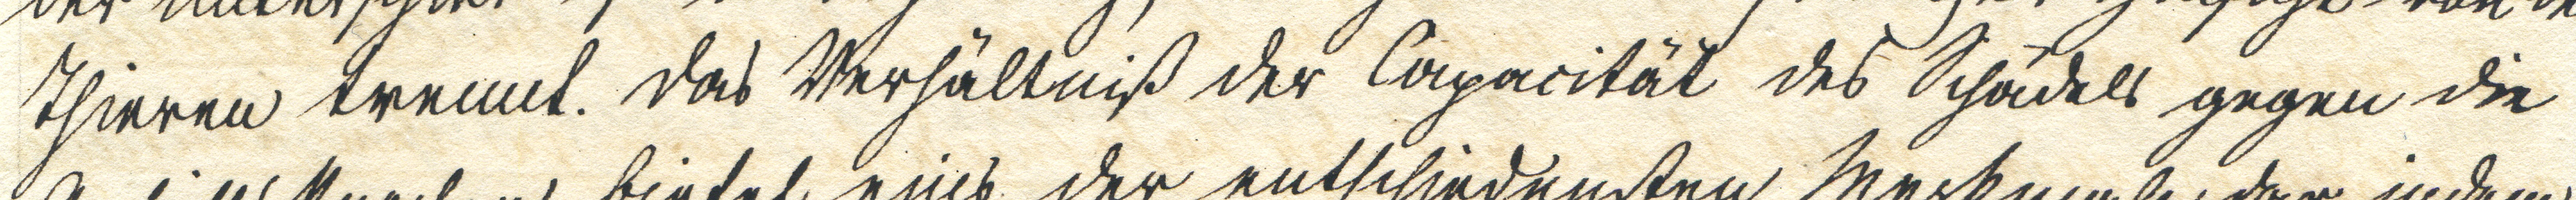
Thieren trennt. Das Verhältniß der Capacität des Schädels gegen die
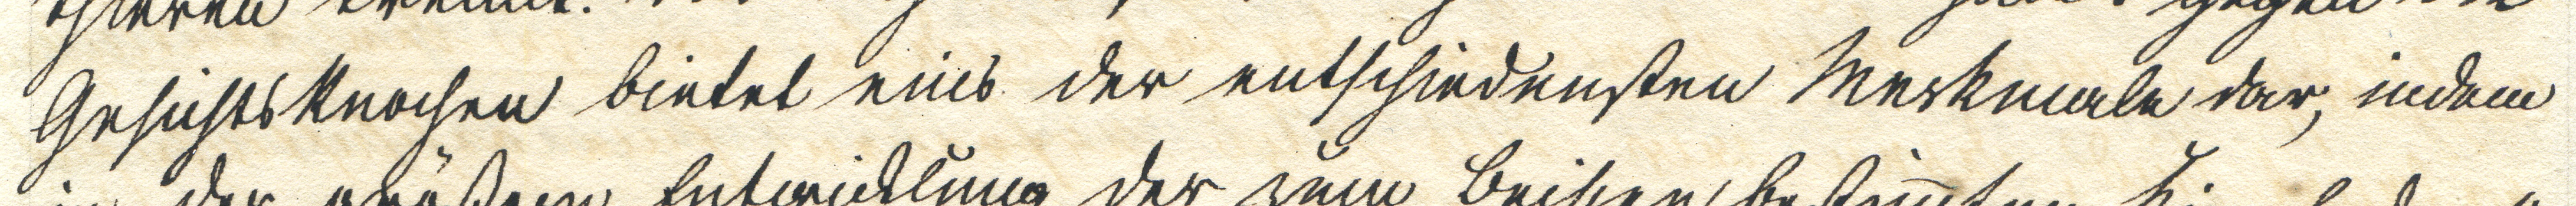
Gesichtsknochen bietet eins der entschiedensten Merkmale dar, indem
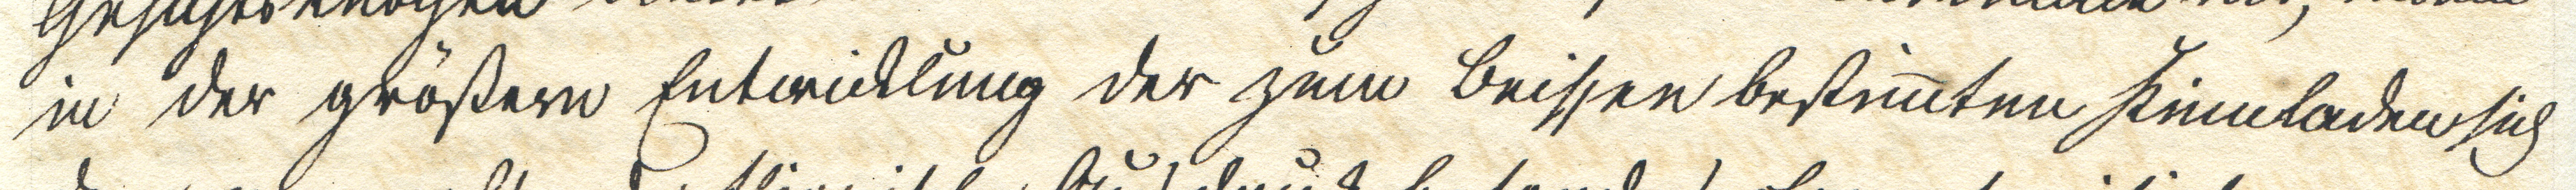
in der größern Entwicklung der zum Beissen bestim̃ten Kinnladen sich
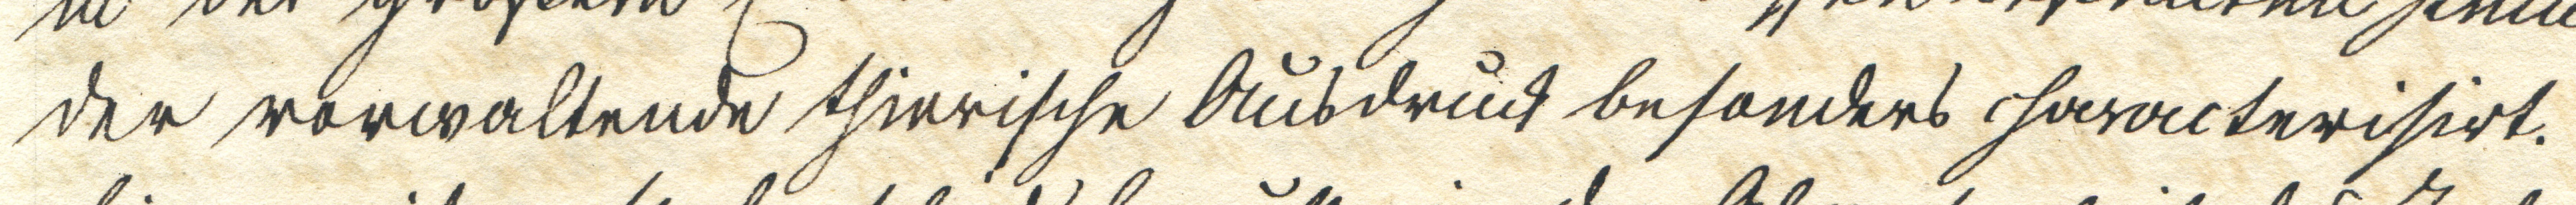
der vorwaltende thierische Ausdruck besonders characterisirt.
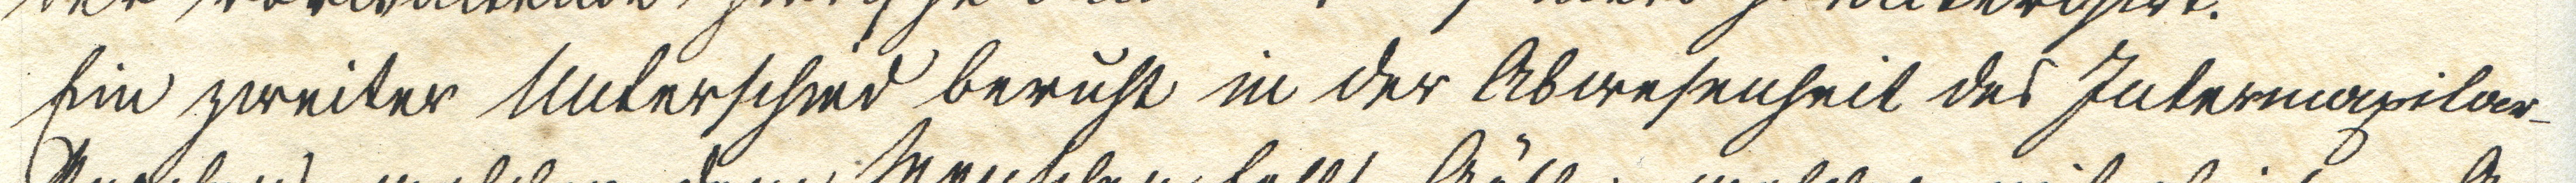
Ein zweiter Unterschied beruht in der Abwesenheit des Intermaxilar-
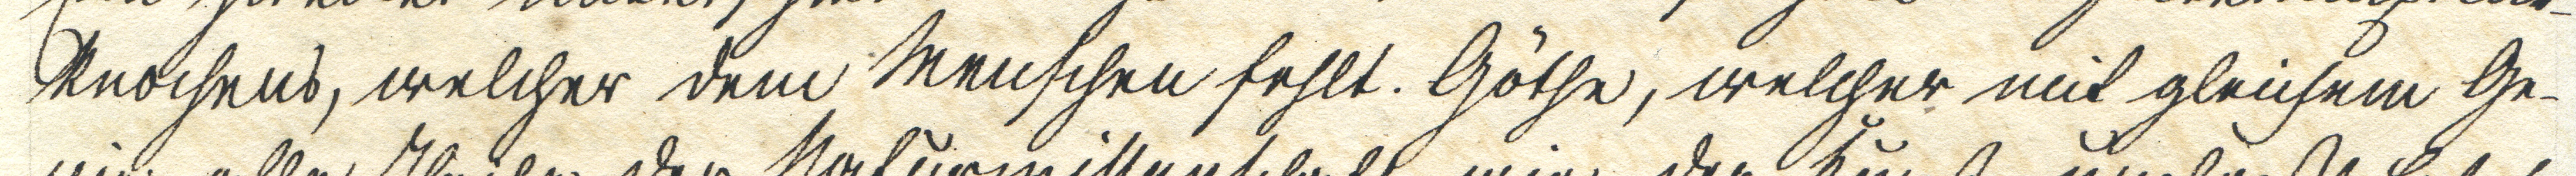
Knochens, welcher dem Menschen fehlt. Göthe, welcher mit gleichem Ge-
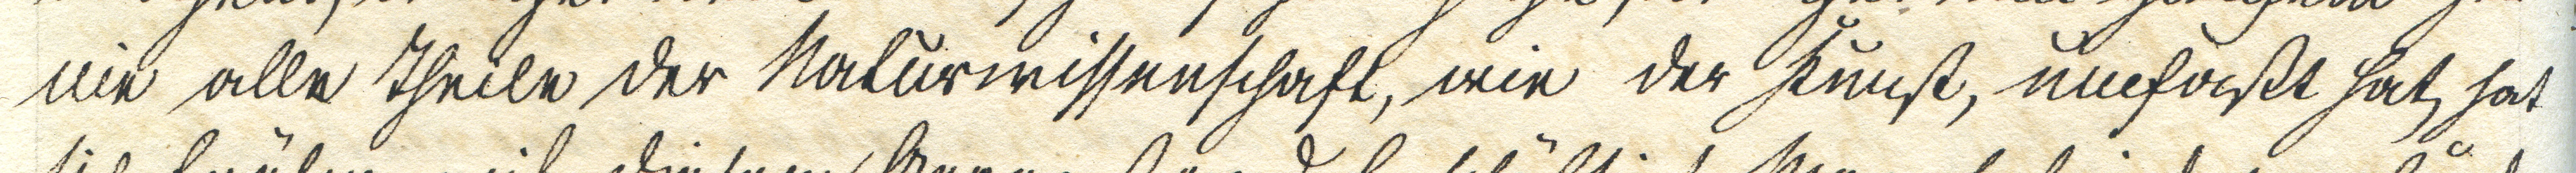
nie alle Theile der Naturwissenschaft, wie der Kunst, umfaßt hat, hat
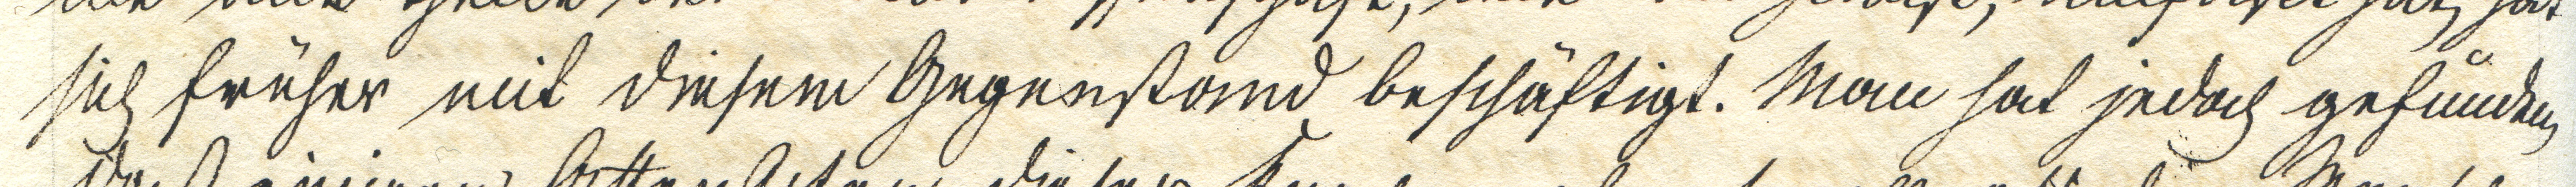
sich früher mit diesem Gegenstand beschäftigt. Man hat jedoch gefunden,
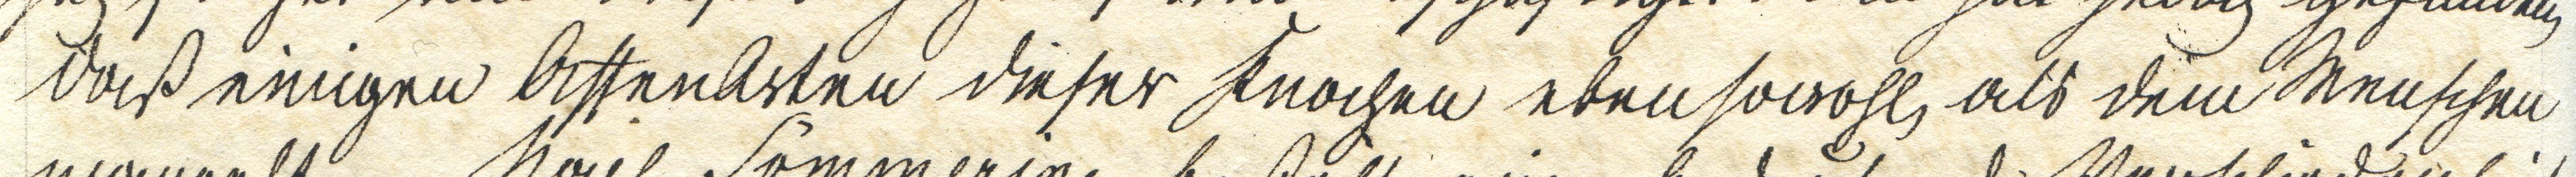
daß einigen AffenArten dieser Knochen ebensowohl, als dem Menschen
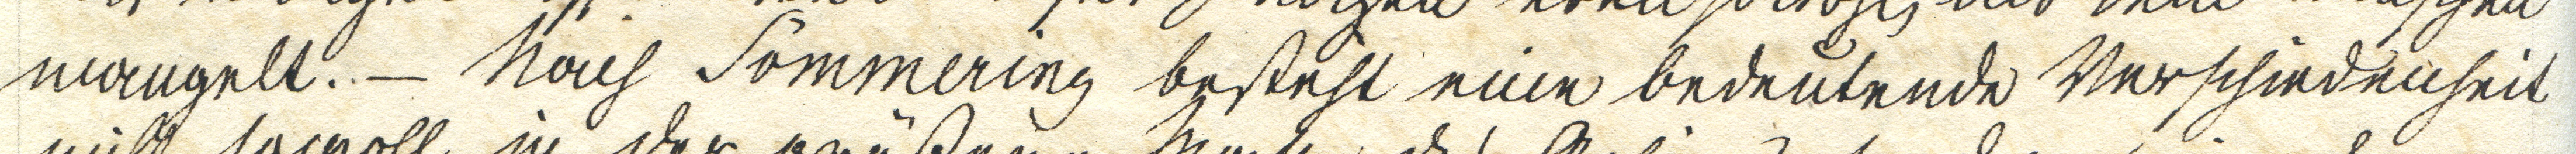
mangelt. – Nach Sömmering besteht eine bedeutende Verschiedenheit
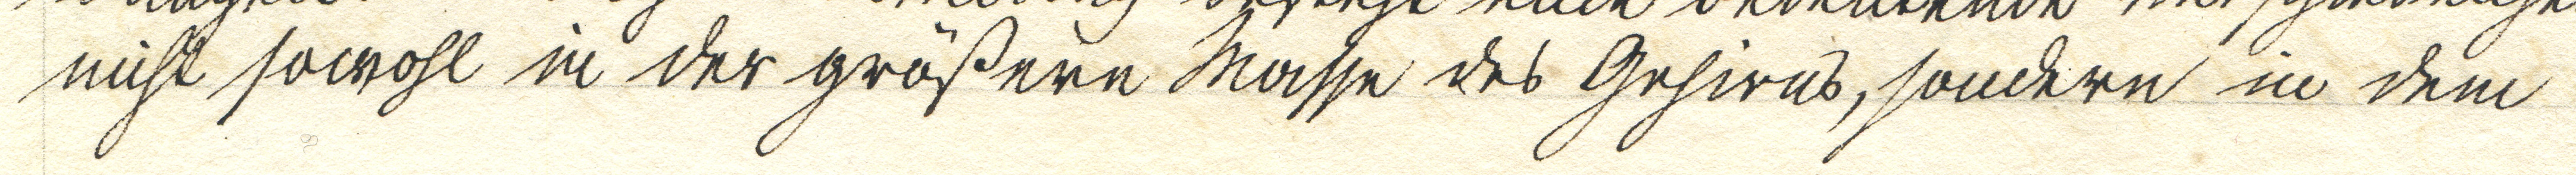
nicht sowohl in der größern Masse des Gehirns, sondern in dem
